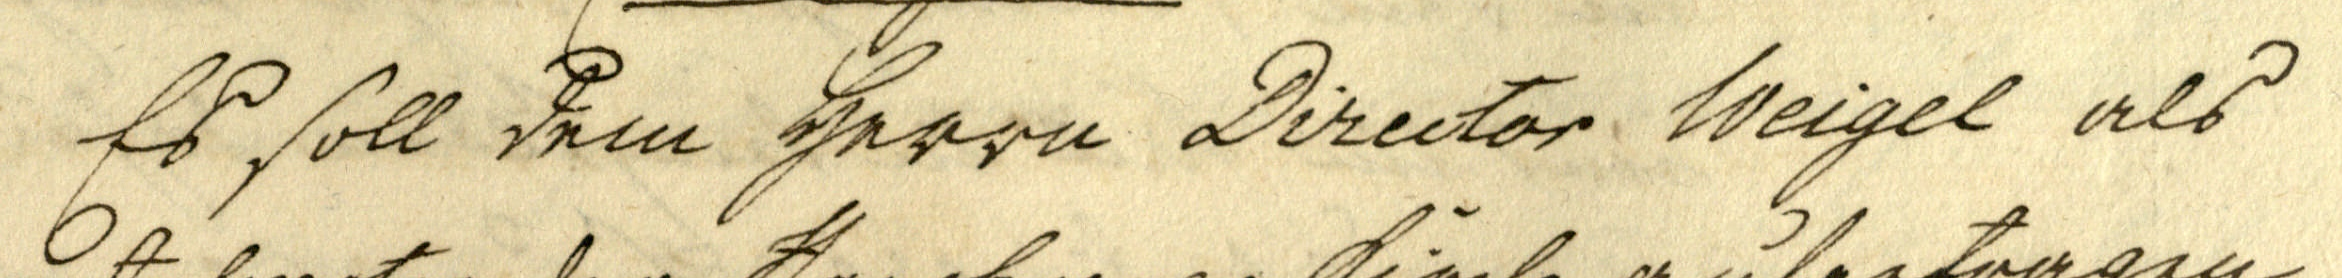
Es soll dem Herrn Director Weigel als
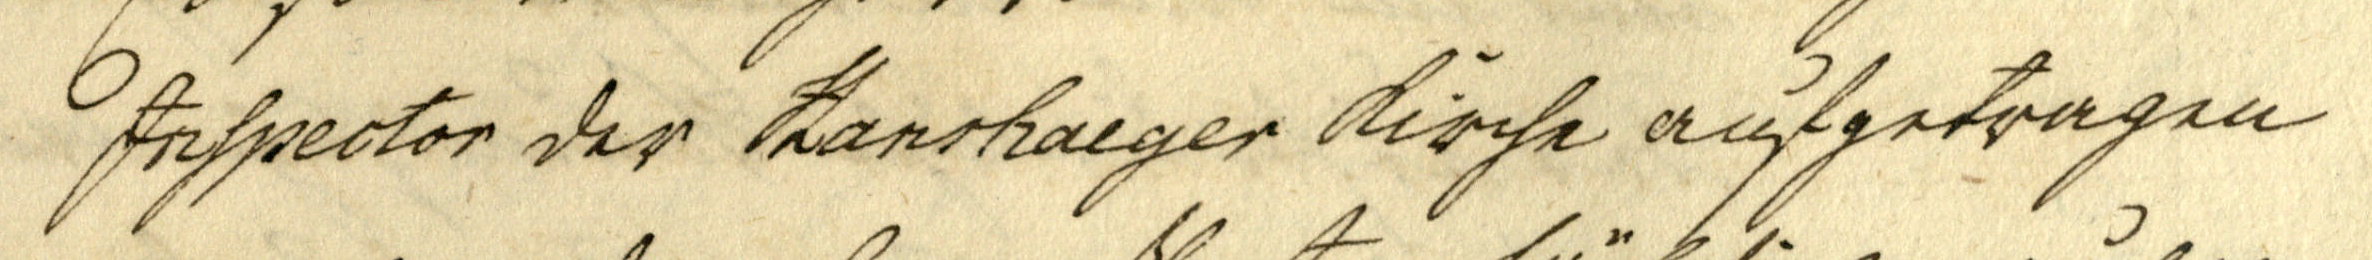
Inspector der Hanshaeger Kirche aufgetragen
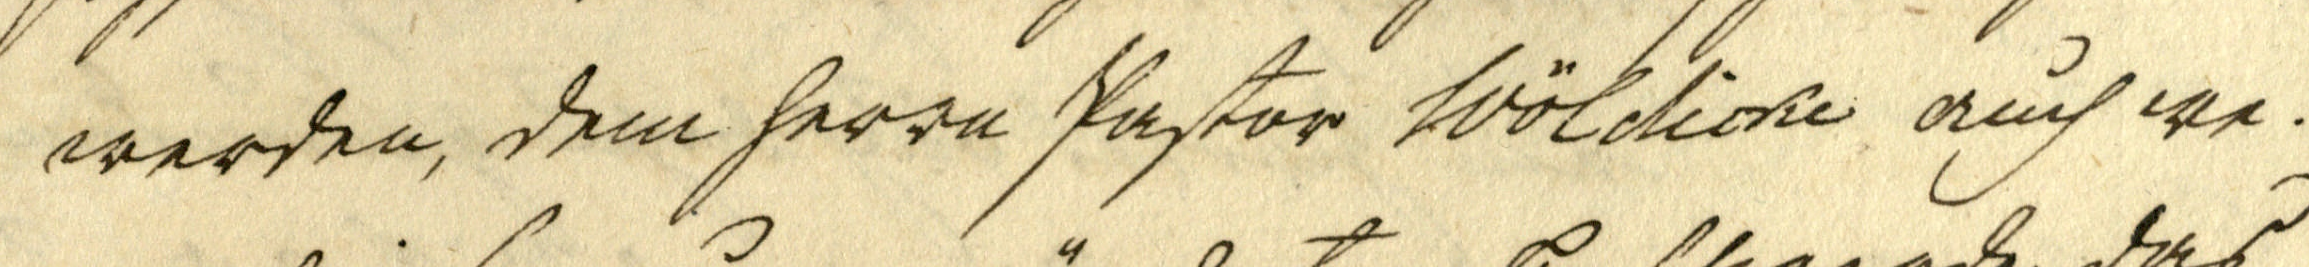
werden, dem Herrn Pastor Wöldicke auch we¬
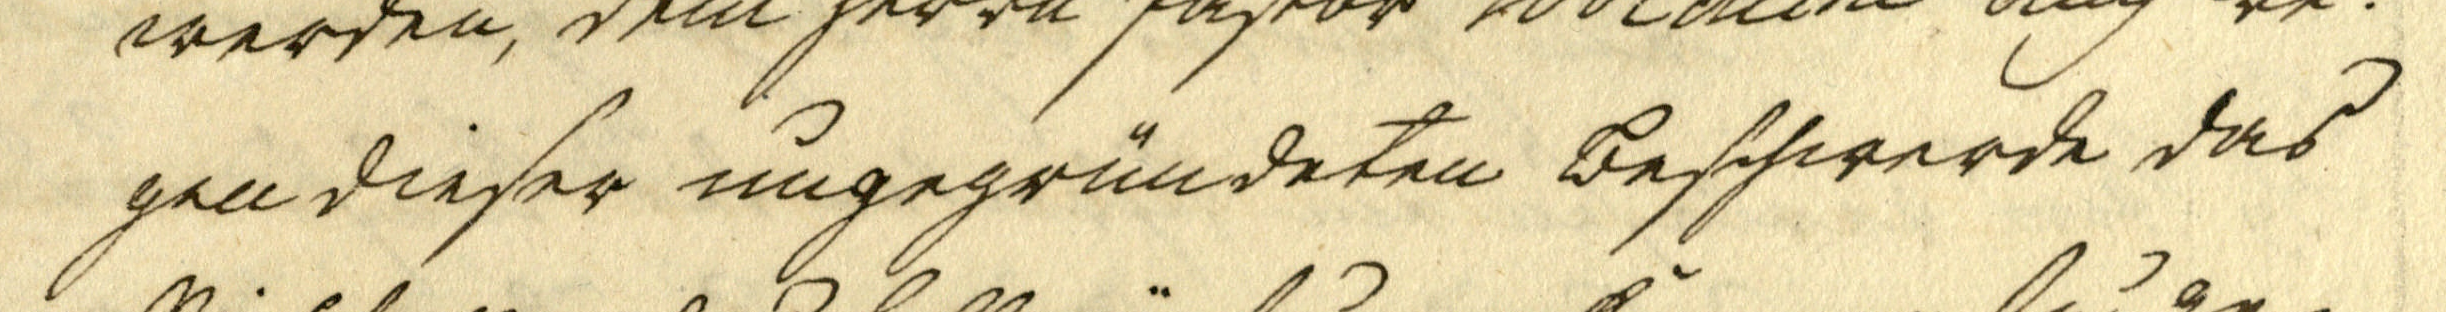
gen dieser umgegründeten Beschwerde das
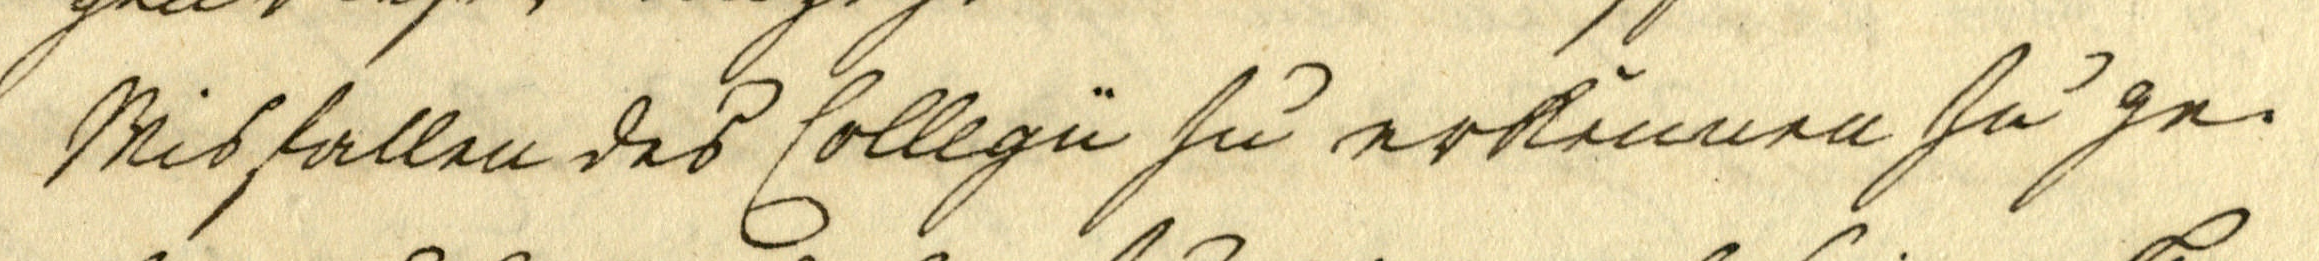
Misfallen des Collegii zu erkennen zu ge¬
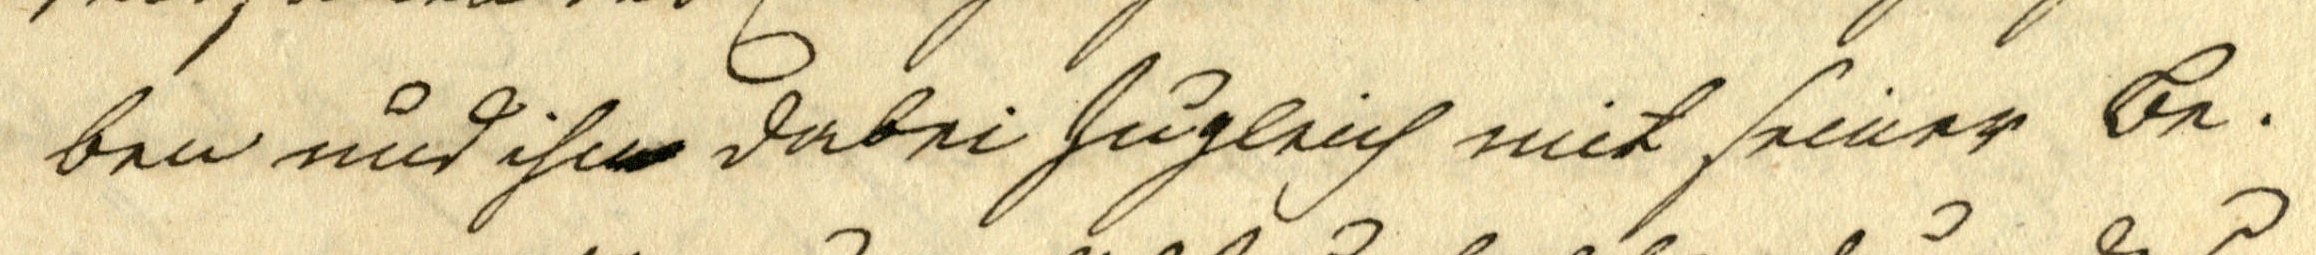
ben und ihn dabei zugleich mit seiner Be¬
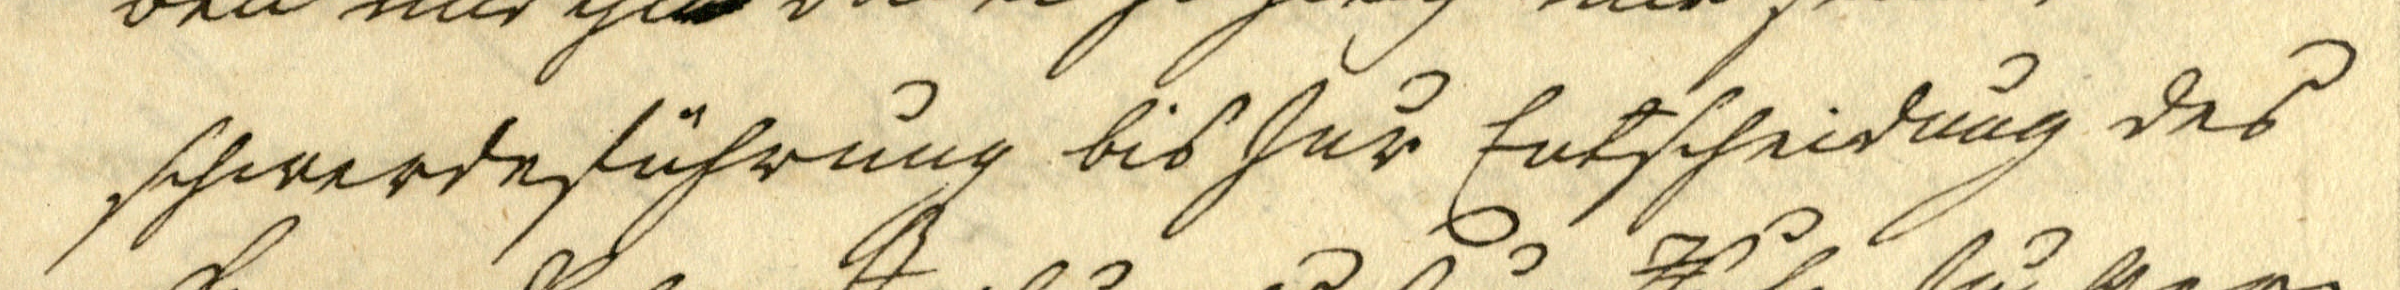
schwerdeführung bis zur Entscheidung des
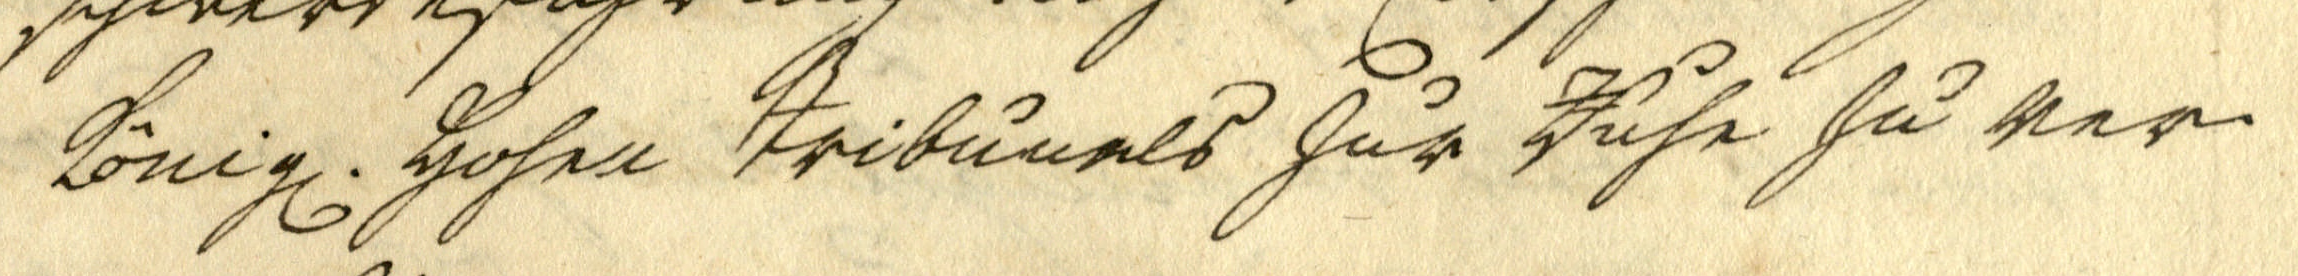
Königl. Hohen Tribunals zur Ruhe zu ver¬
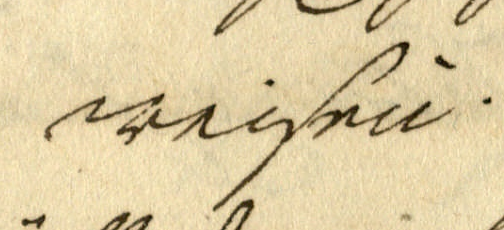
weisen.
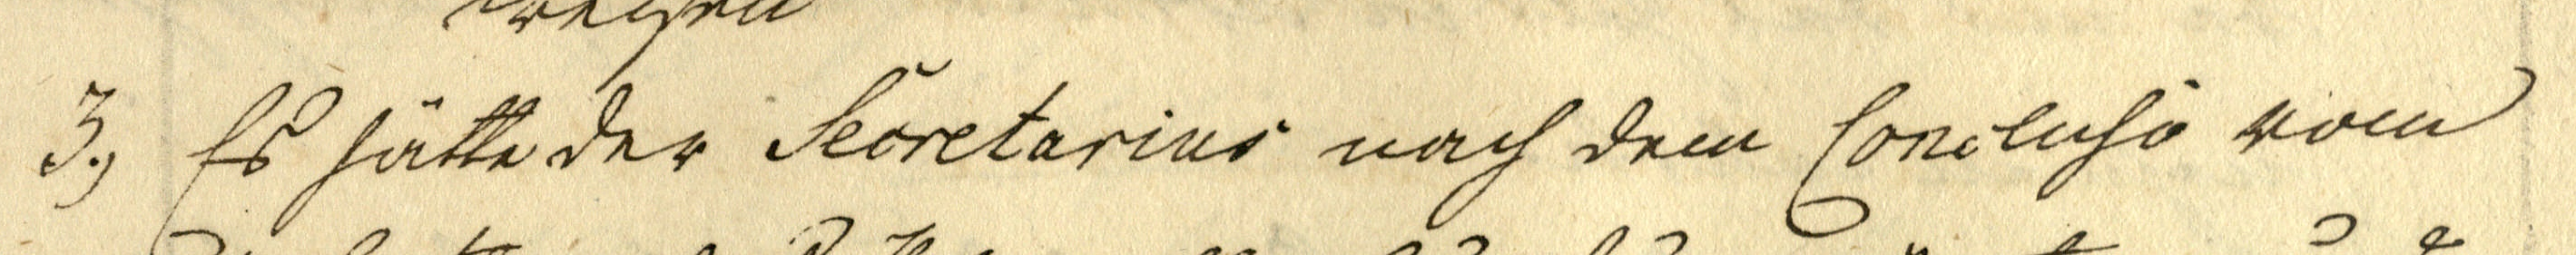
3., Es hätte der Secretarius nach dem Concluso vom
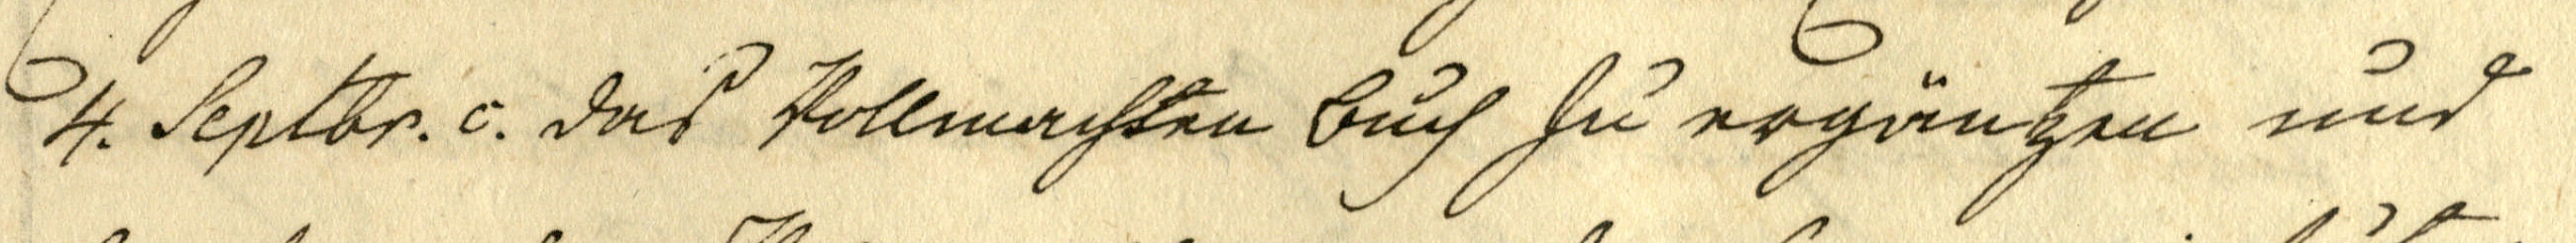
4. Septbr. c. das Vollmachten Buch zu ergäntzen und
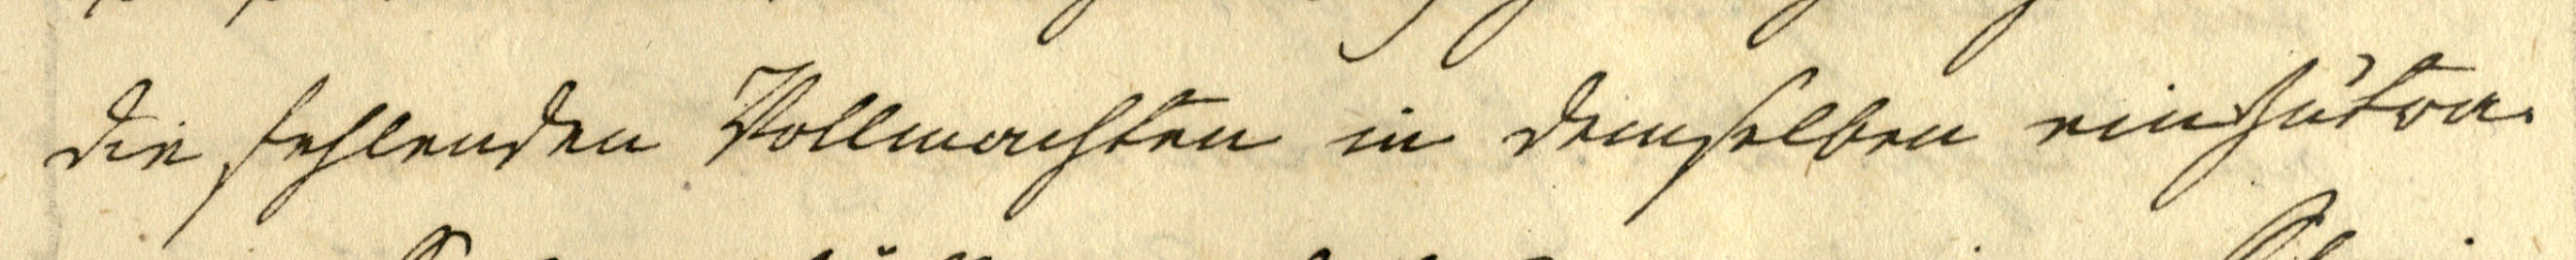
die fehlenden Vollmachten in demselben einzutra¬
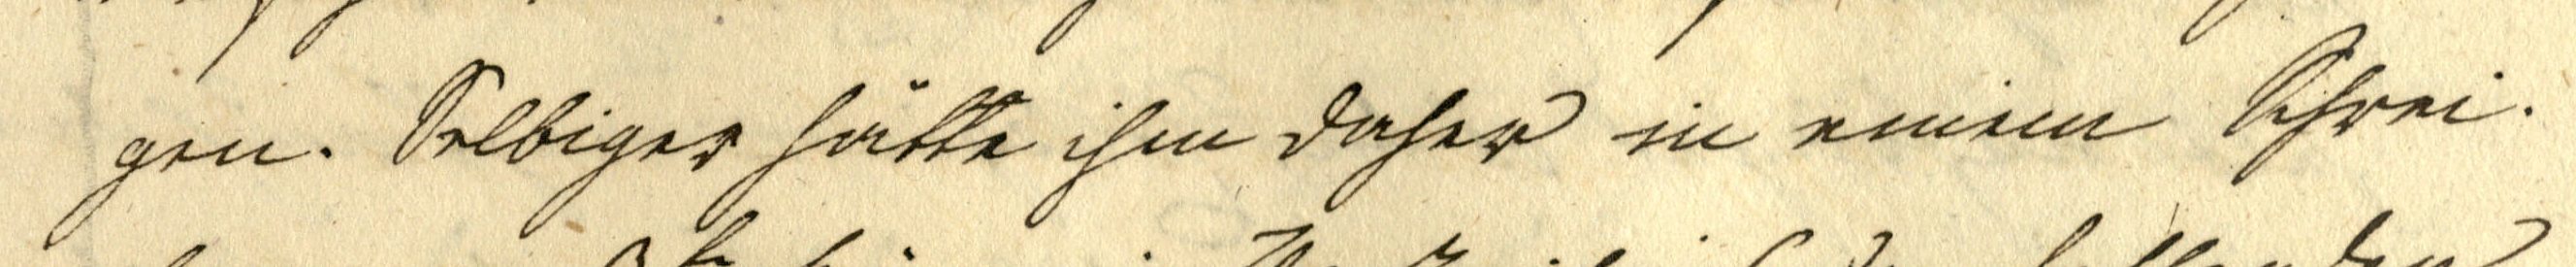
gen. Selbiger hätte ihm daher in einem Schrei¬
